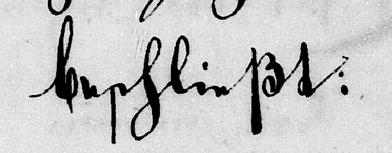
Beschließt:
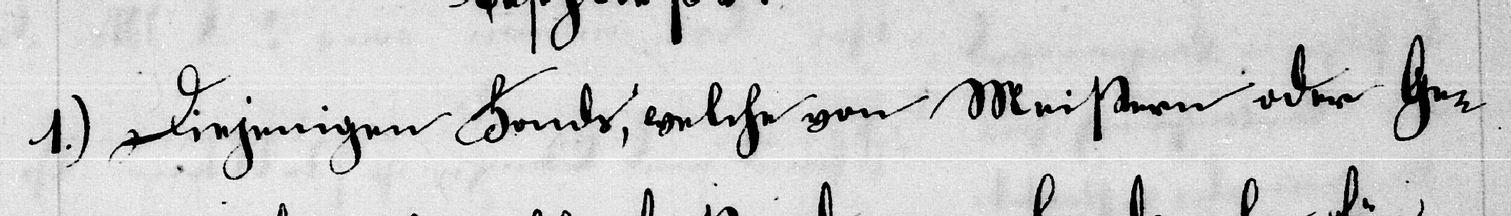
1.) Diejenigen Fonds, welche von Meistern oder Ge¬
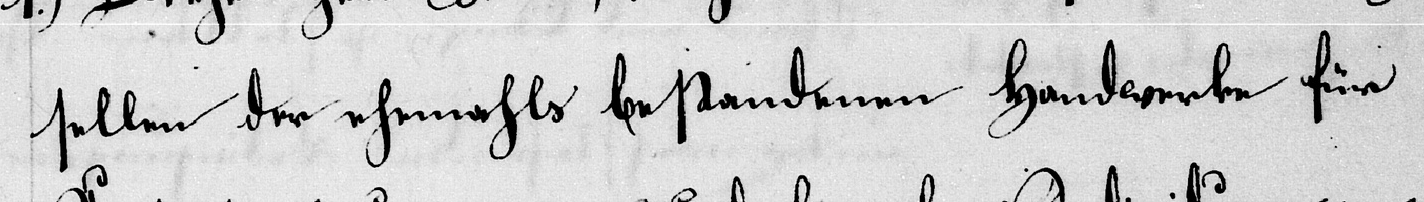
sellen der ehemahls bestandenen Handwerke für
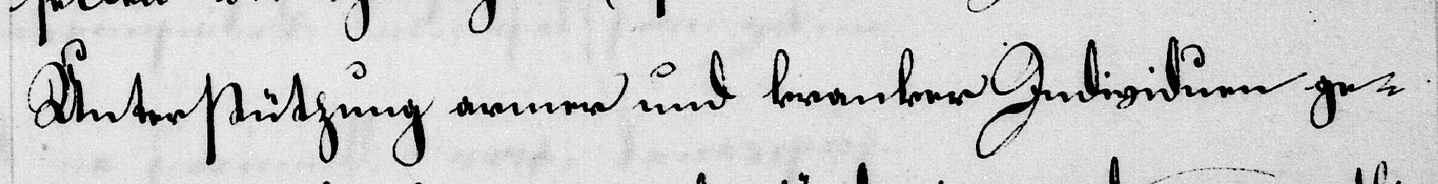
Unterstützung armer und kranker Individuen ge¬
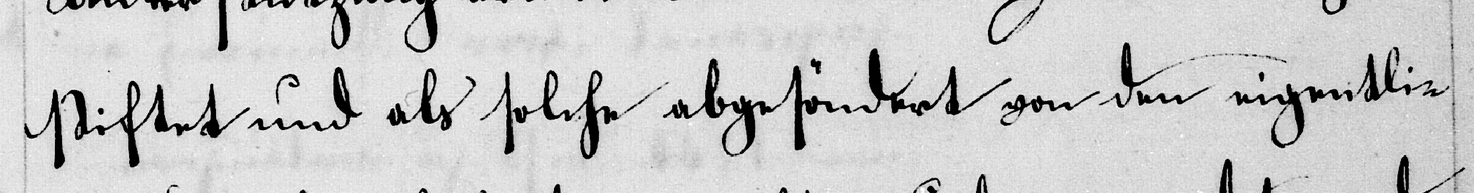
stiftet und als solche abgesöndert von den eigentli¬
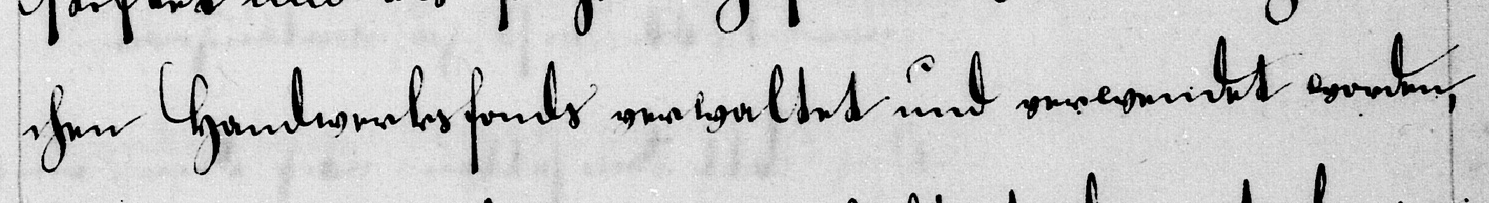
chen Handwerksfonds verwaltet und verwendet worden,
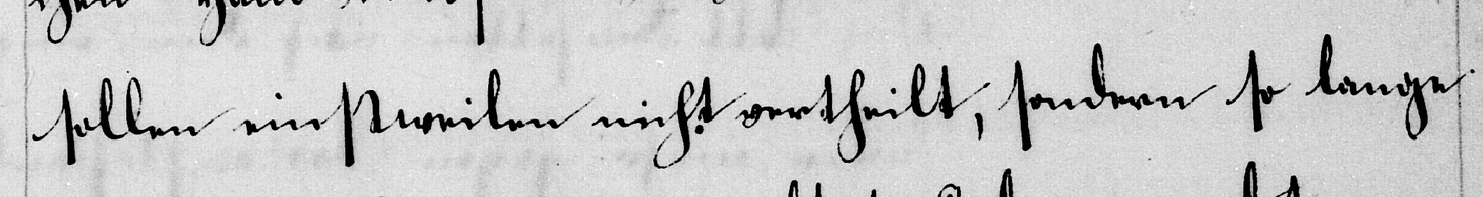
sollen einstweilen nicht vertheilt, sondern so lange
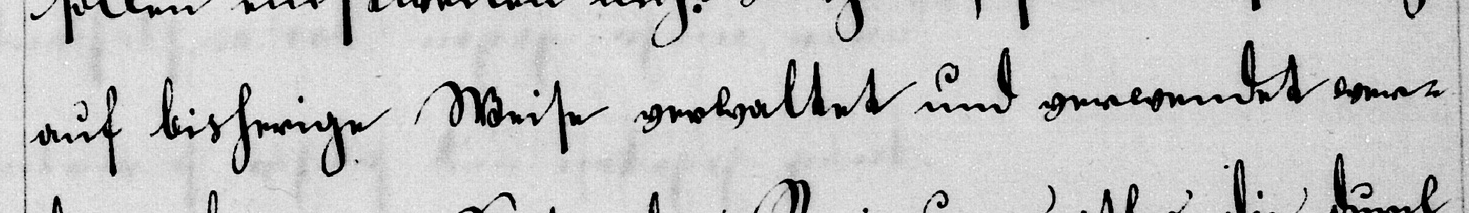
auf bisherige Weise verwaltet und verwendet wer¬
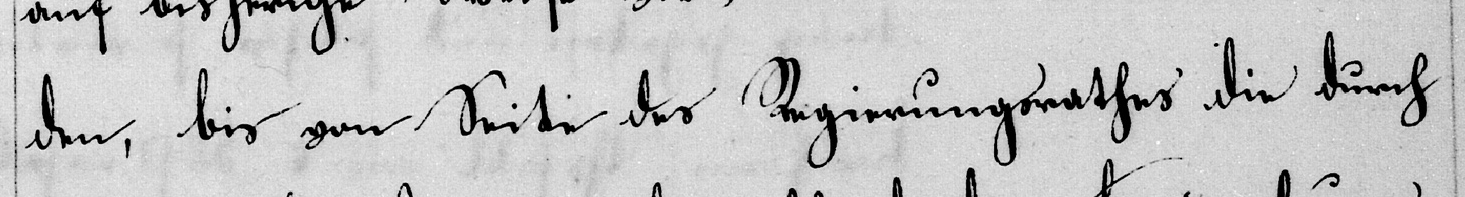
den, bis von Seite des Regierungsrathes die durch
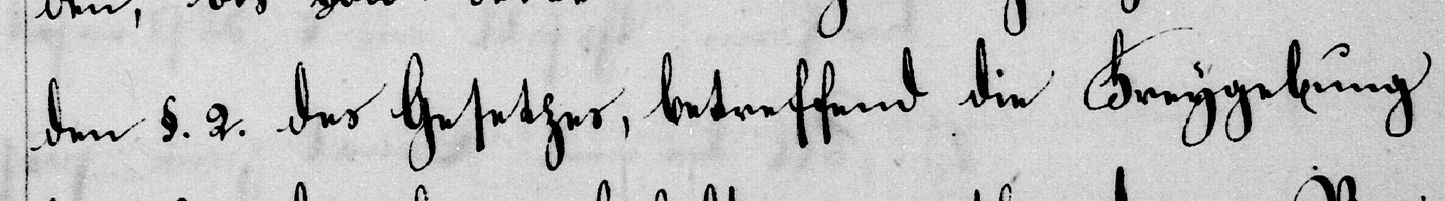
den §. 2. des Gesetzes, betreffend die Freygebung
